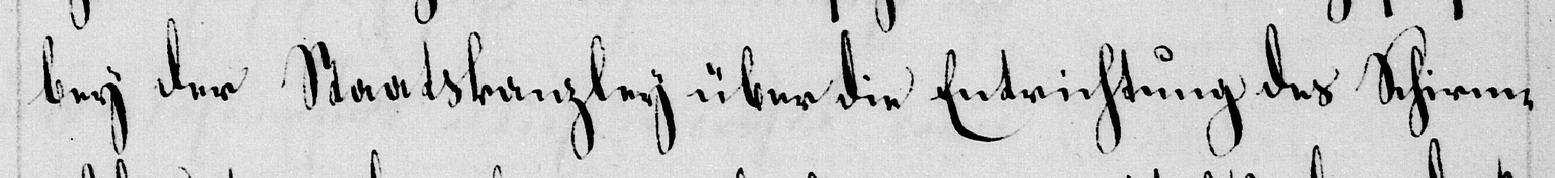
bey der Staatskanzley über die Entrichtung des Schirm¬
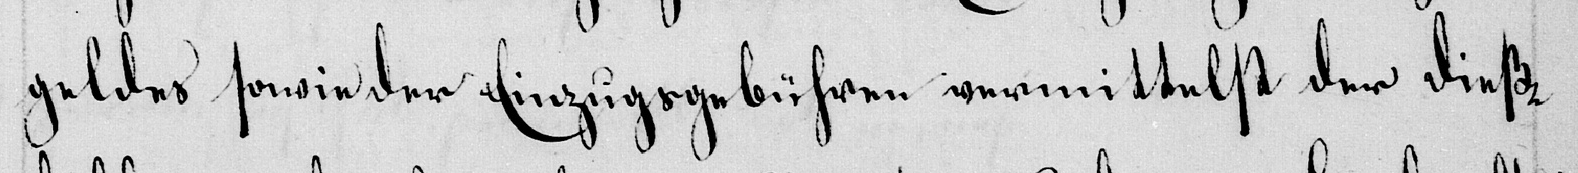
geldes sowie der Einzugsgebühren vermittelst der dieß¬
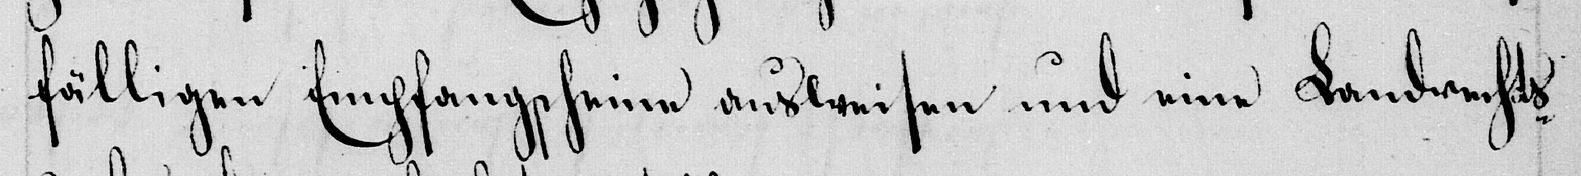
fälligen Empfangsscheine ausweisen und eine Landrechts¬
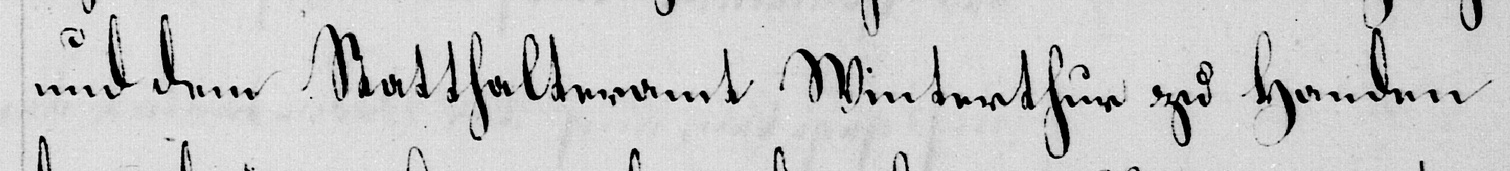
und dem Statthalteramt Winterthur zu Handen
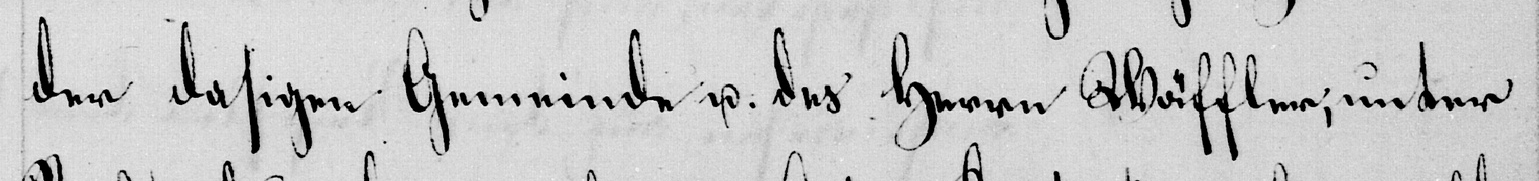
der dasigen Gemeinde u. des Herrn Wäffler, unter
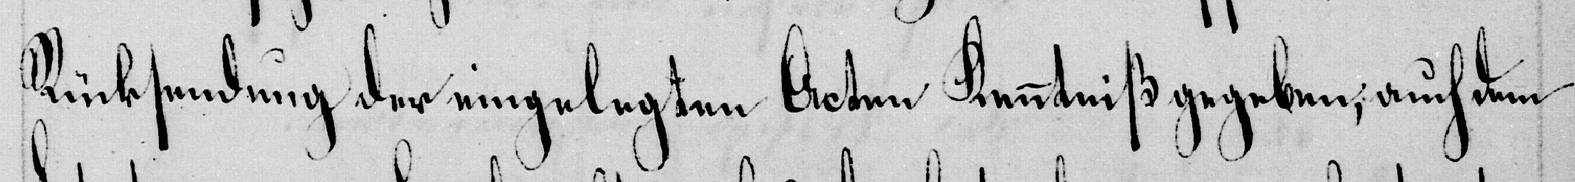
Rücksendung der eingelegten Acten Kenntniß gegeben, auch dem
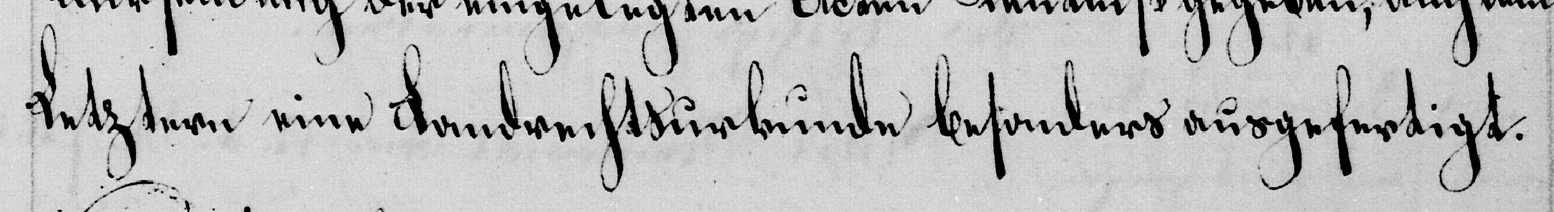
Letztern eine Landrechtsurkunde besonders ausgefertigt.
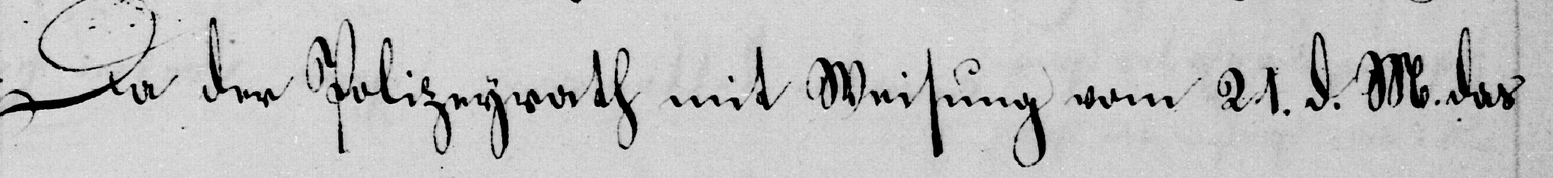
Da der Polizeyrath mit Weisung vom 21. d. M. das
